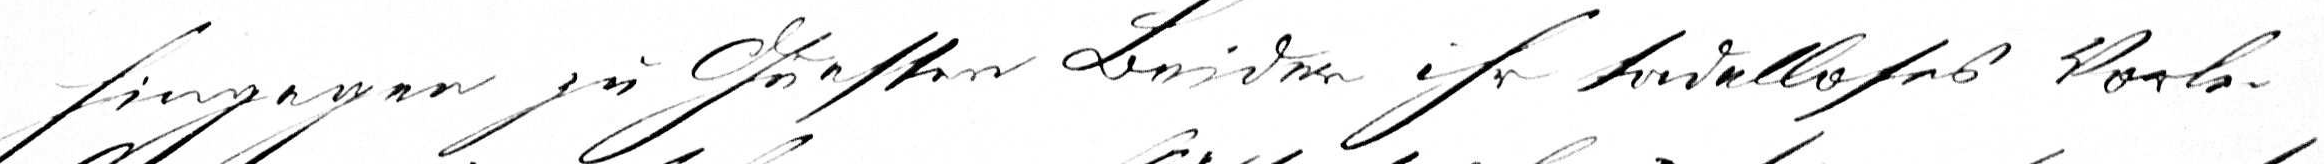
hingegen zu Geesten Beider ihr tadelloses Vorle¬
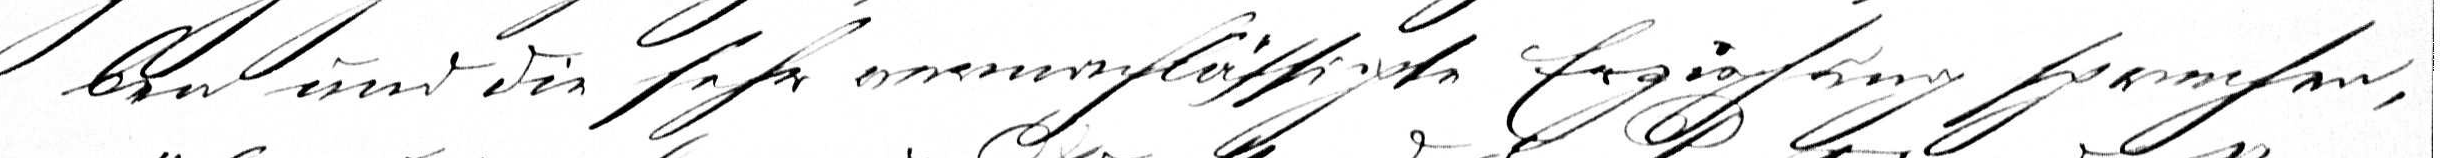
ben und die sehr vernachlässigte Erziehung sprechen,
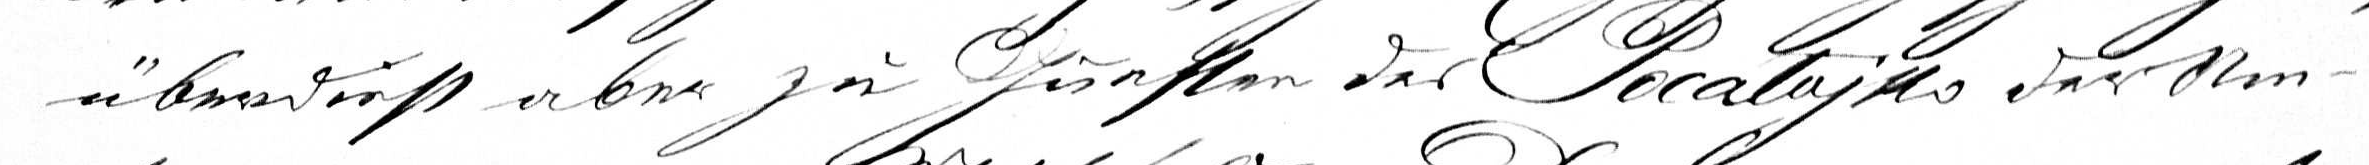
überdieß aber zu Gunsten der Pocatujko der Um¬
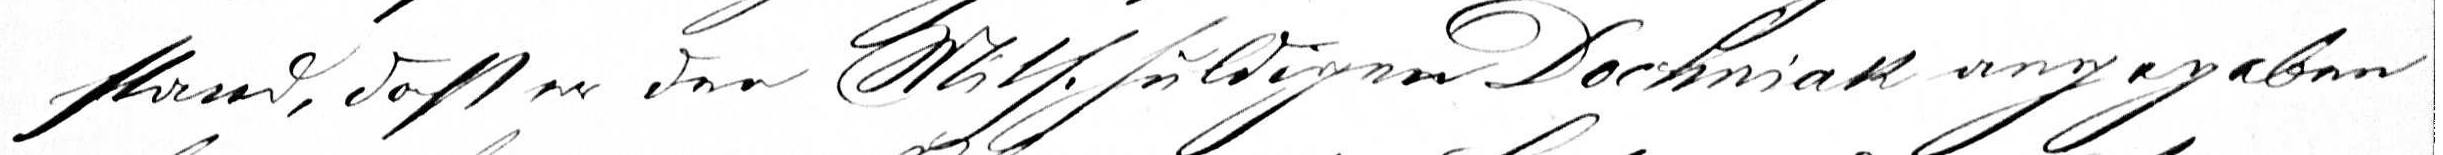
stand, daß er den Mitschuldigen Dochniak angegeben
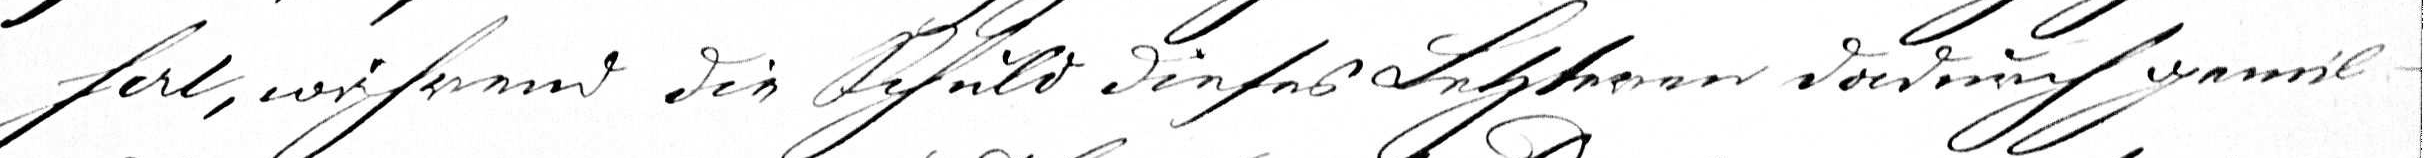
hat, während die Schuld dieses Letzteren dadurch gemil¬
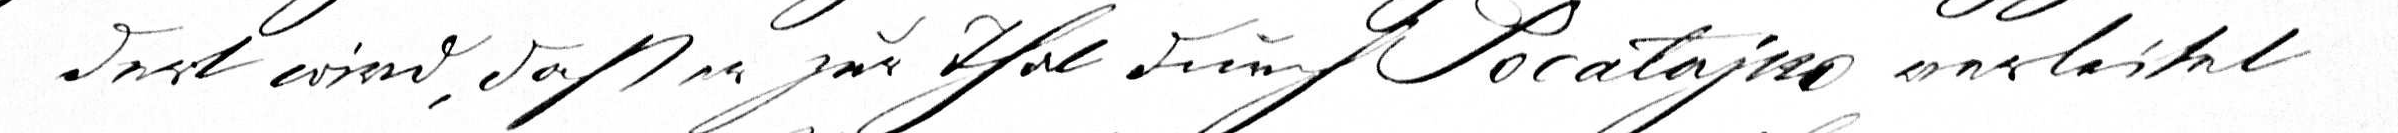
dert wird, daß er zur That durch Pocatujko verteitet
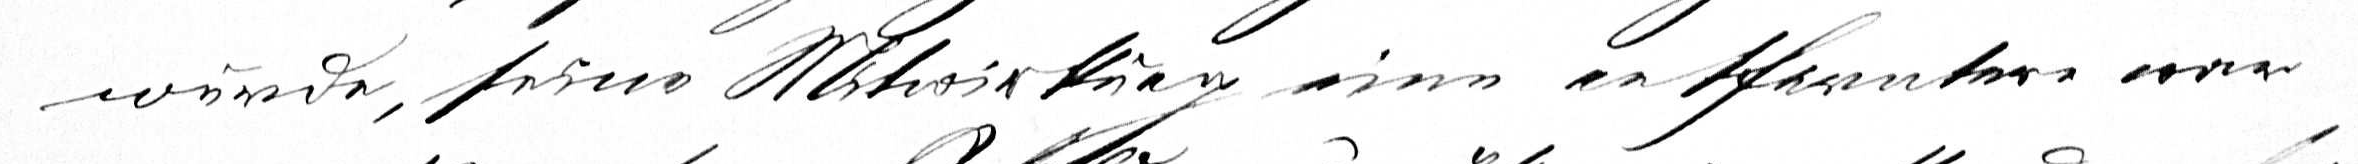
wurde, seine Mitwirkung eine entferntere war
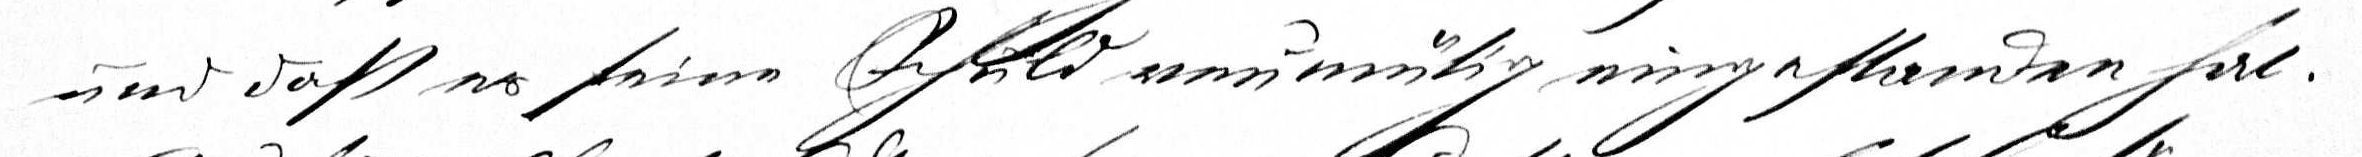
und daß er seine Schuld reumütig eingestanden hat.
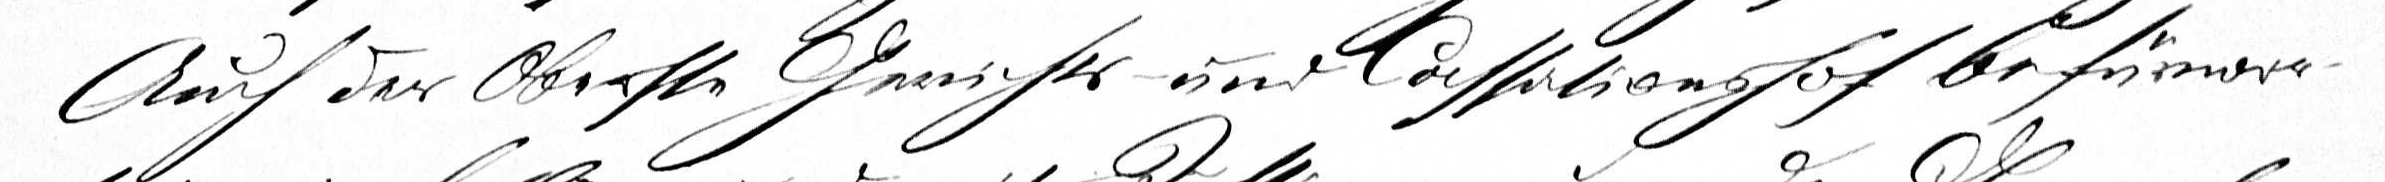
Auch der Oberste Gerichts und Cassationshof befürwor¬
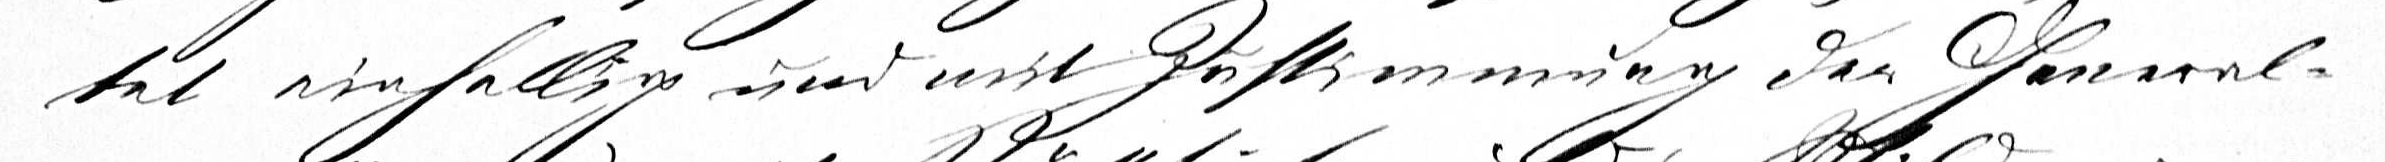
tet einhellig und mit Zustimmung der General¬
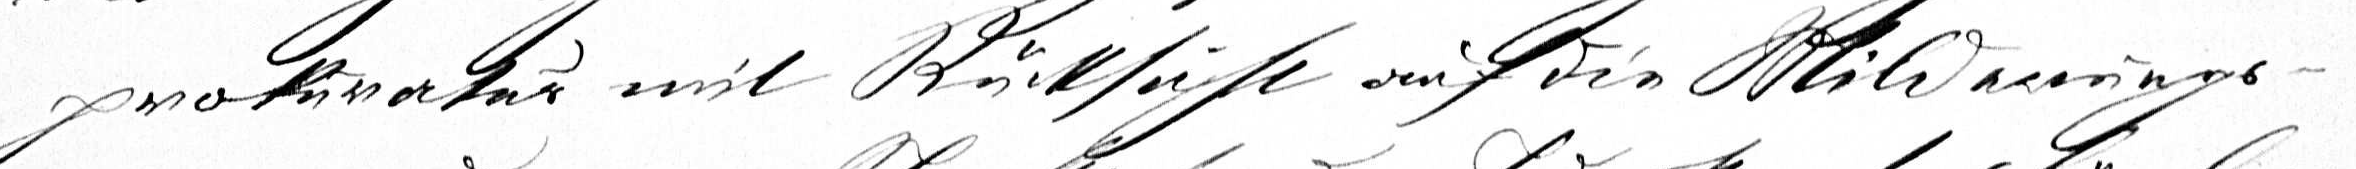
prokuratur mit Rücksicht auf die Milderungs¬
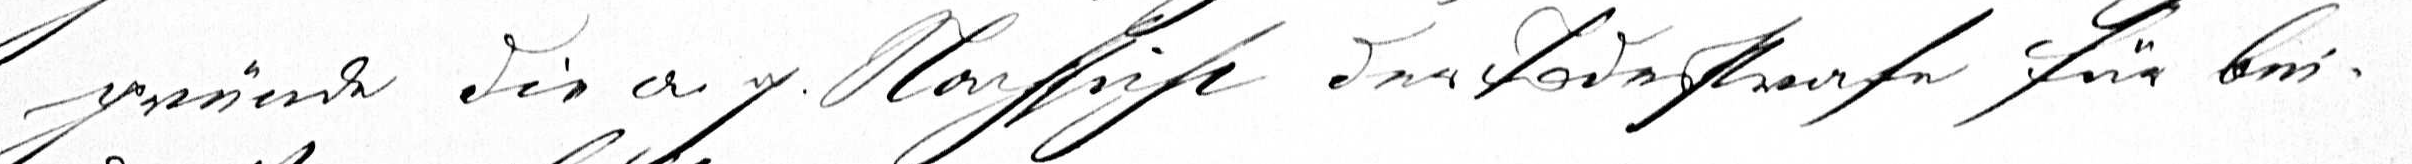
gründe die a. g. Nachsicht der Todesstrafe für bei¬
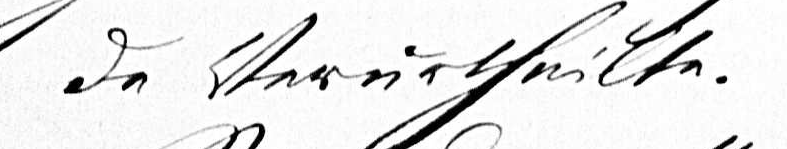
de Verurtheilte.
